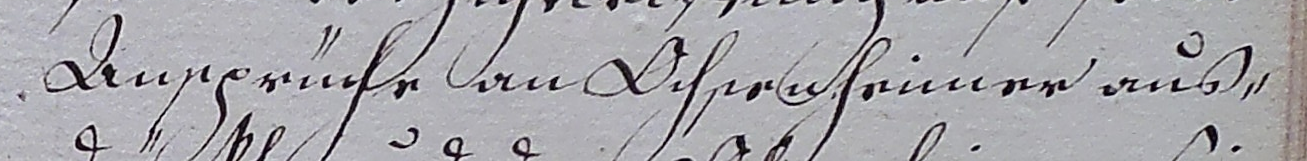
Ansprüche an Ochsenheimer aus¬
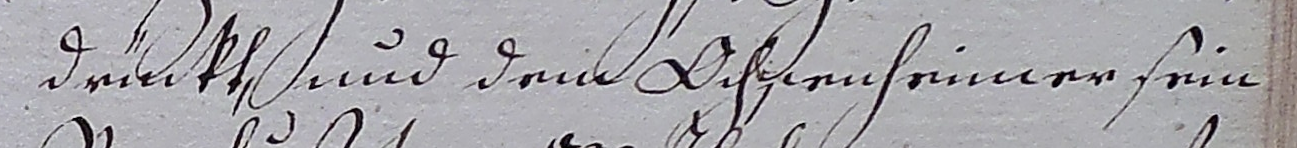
drückt, und dem Ochsenheimer sein
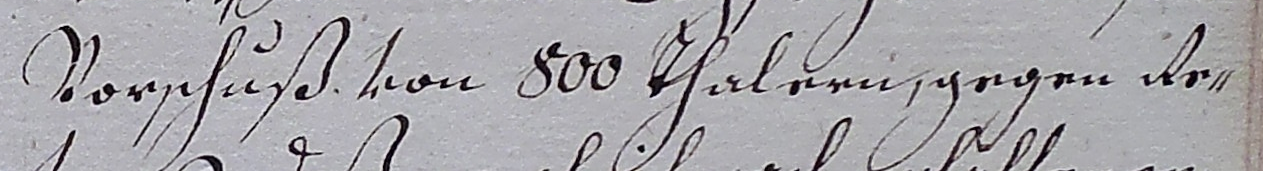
Vorschuß von 800 Thalern, gegen Re¬
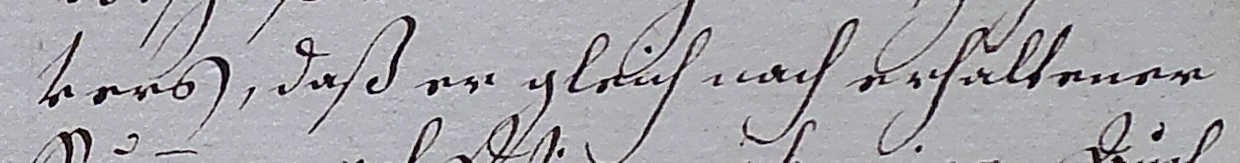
vers, daß er gleich nach erhaltener
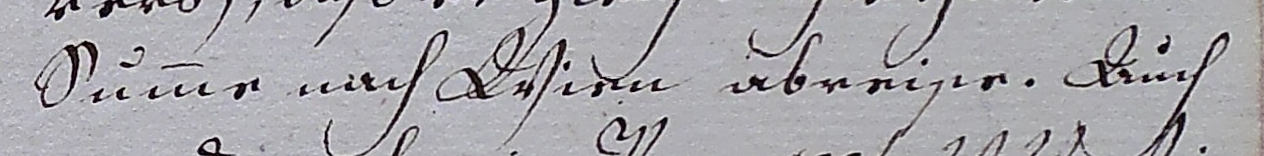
Sum̅e nach Wien abreise. Auch
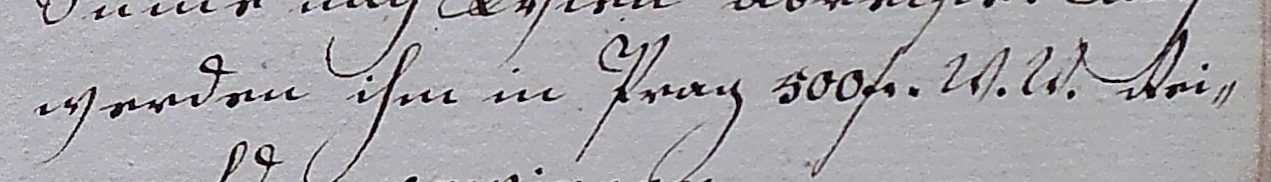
werden ihm im Prag 500fr. W.W Rei¬
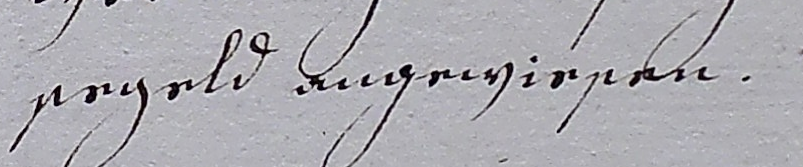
segeld angewiesen.
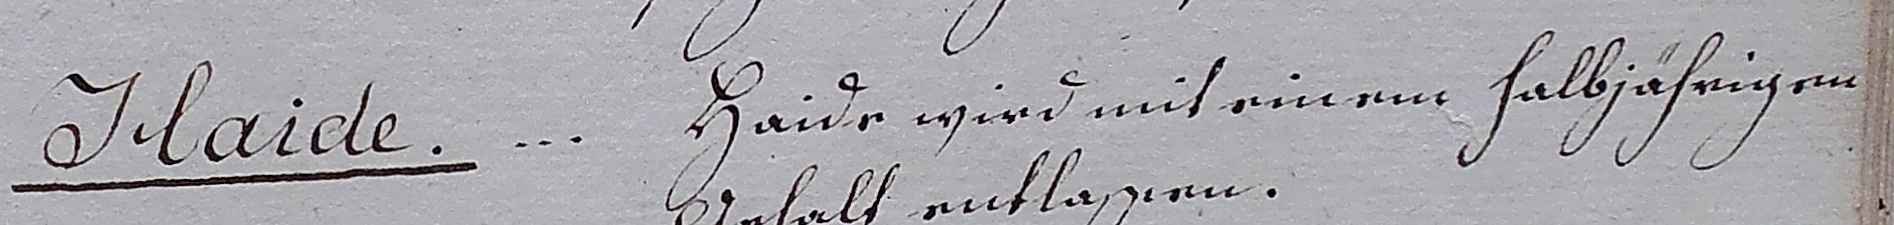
Haide. ... Haide wird mit einem halbjährigen
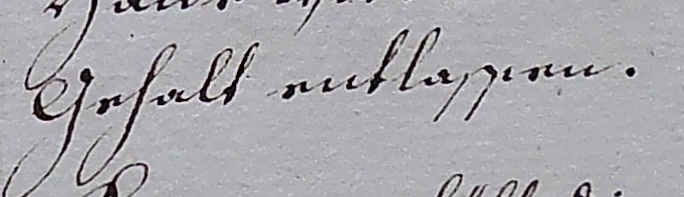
Gehalt entlassen.
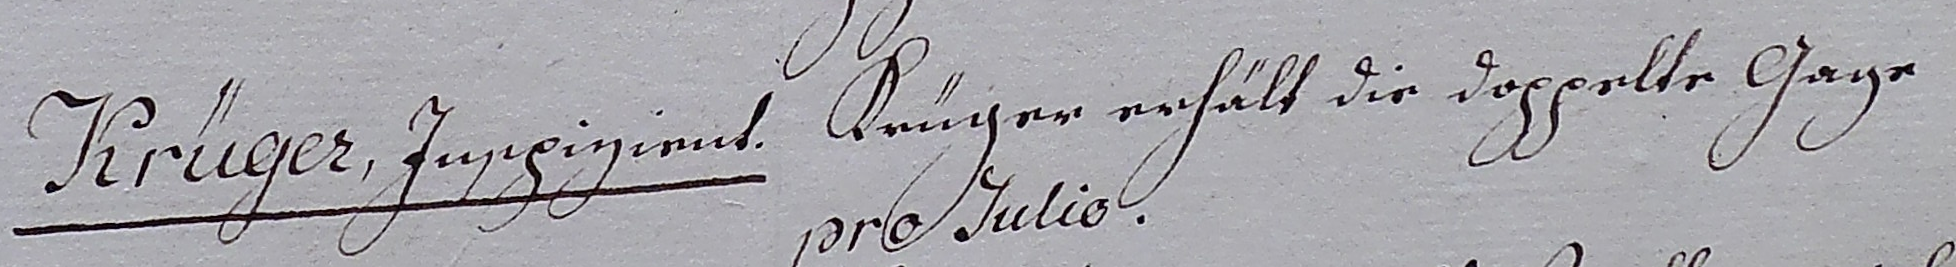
Krüger, Inspizient. Krüger erhält die doppelte Gage
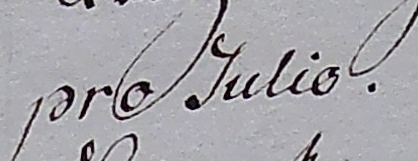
pro Julio.
